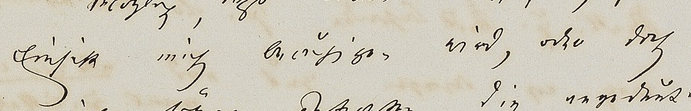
Einsicht mich beruhigen wird, oder doch,
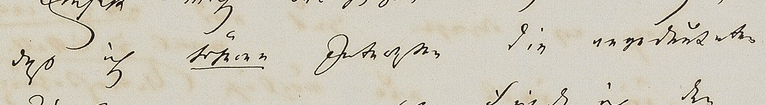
daß ich höheren Intereßen die angedeuteten
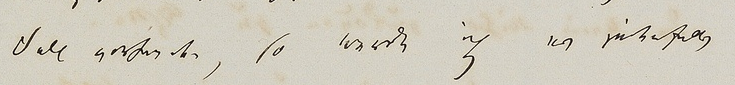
Fall vorhanden, so werde ich es jedenfalls
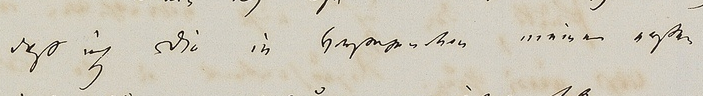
daß ich Dir in Vorstehendem meinen ersten
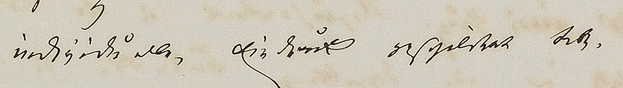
individuellen Eindruck geschildert habe.
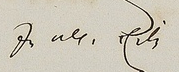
In aller Eile
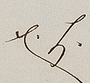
E. H.
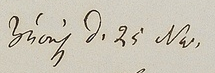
Zürich d. 25 Nov.
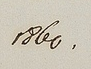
1860.
